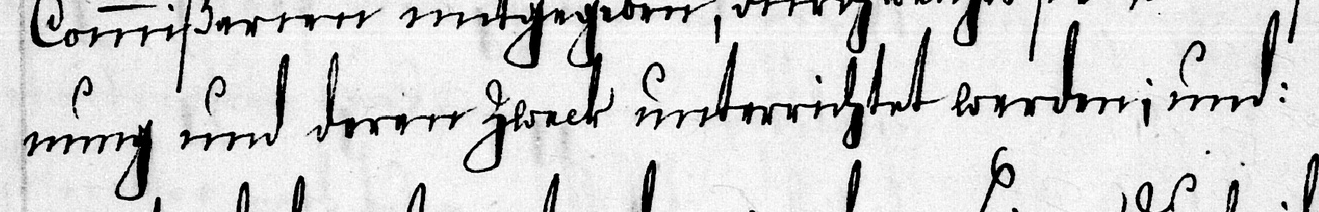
dnung und deren Zweck unterrichtet werden; und:
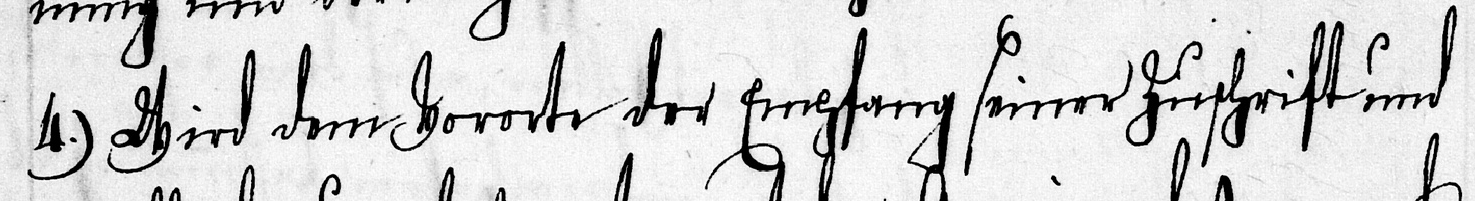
4.) Wird dem Vororte der Empfang seiner Zuschrift und
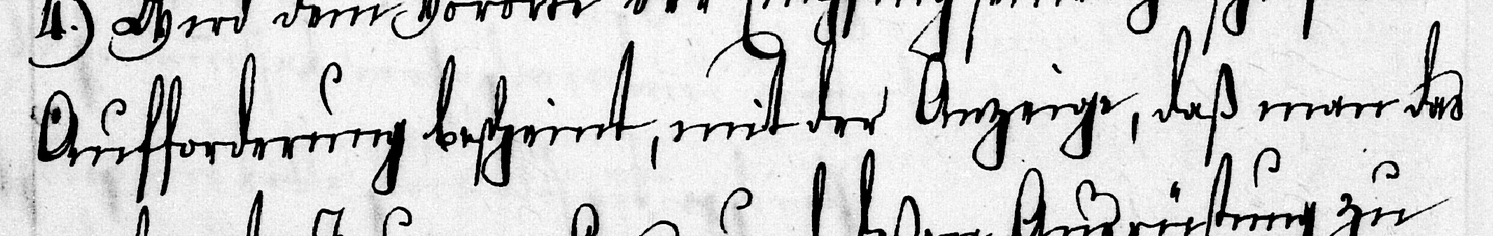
Aufforderung bescheint, mit der Anzeige, daß man das
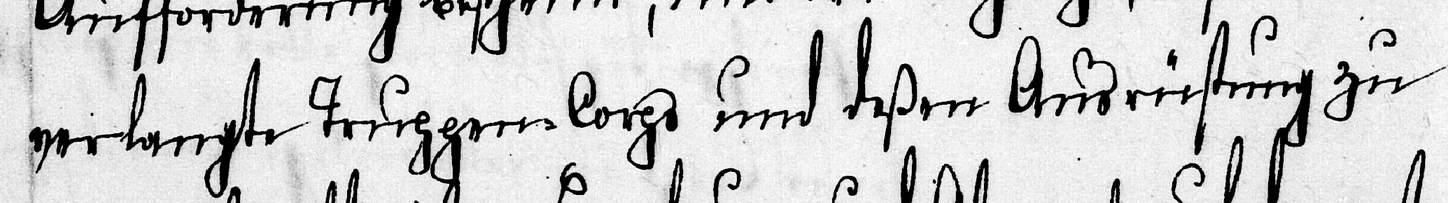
verlangte Truppen-Corps und deßen Ausrüstung zu
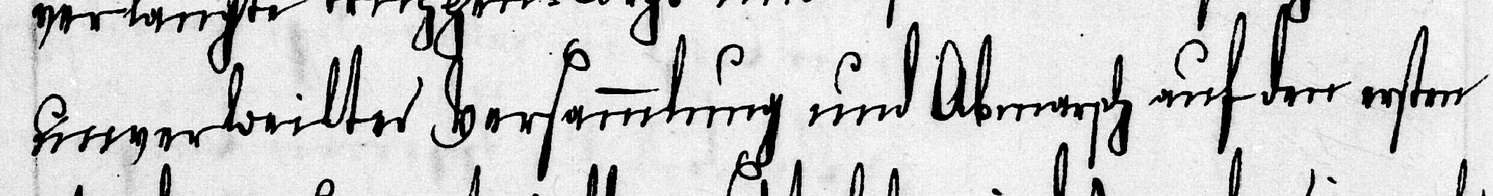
unverweilter Versammlung und Abmarsch auf den ersten
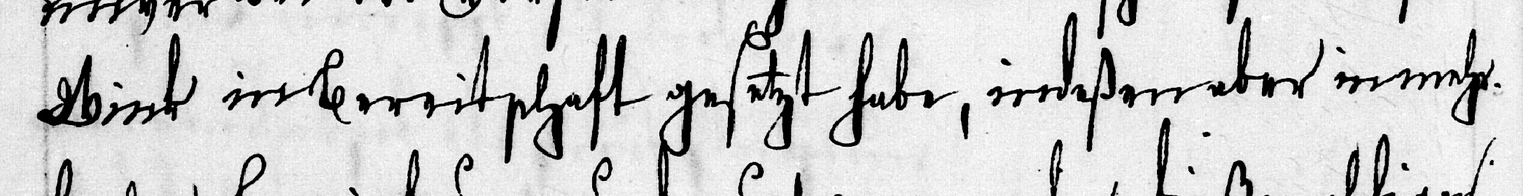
Wink in Bereitschaft gesetzt habe, indeßen aber in mehr¬
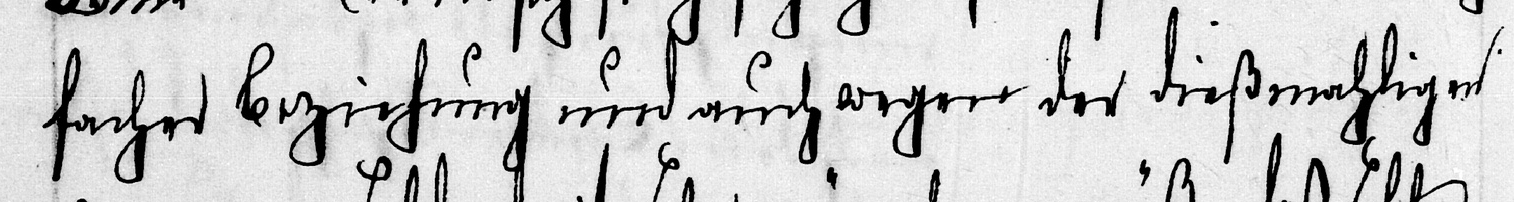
facher Beziehung und auch wegen der dießmahligen
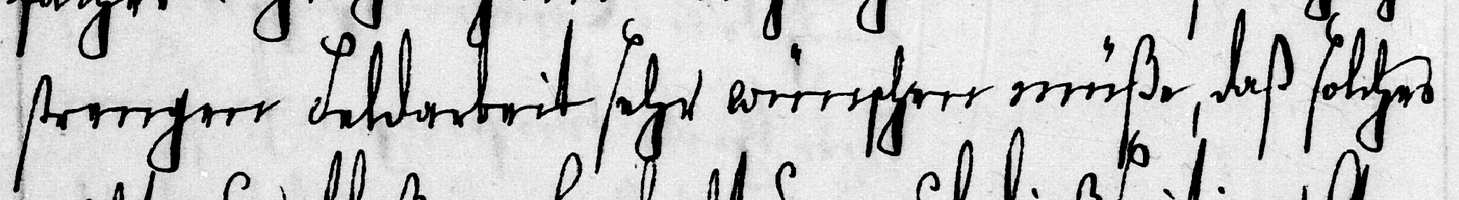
strengen Feldarbeit sehr wünschen müße, daß solches
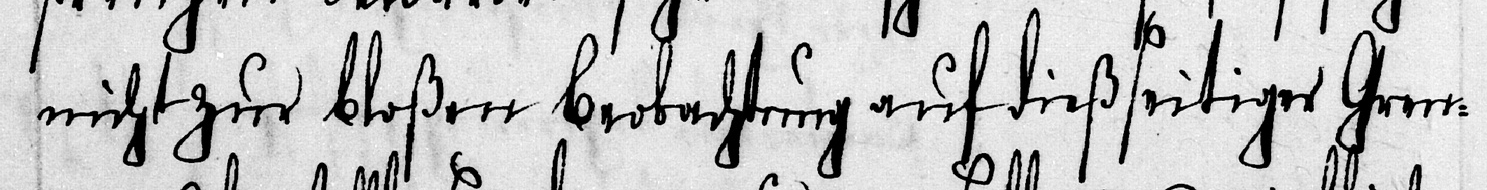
nicht zur bloßen Beobachtung auf dießseitiger Gren¬
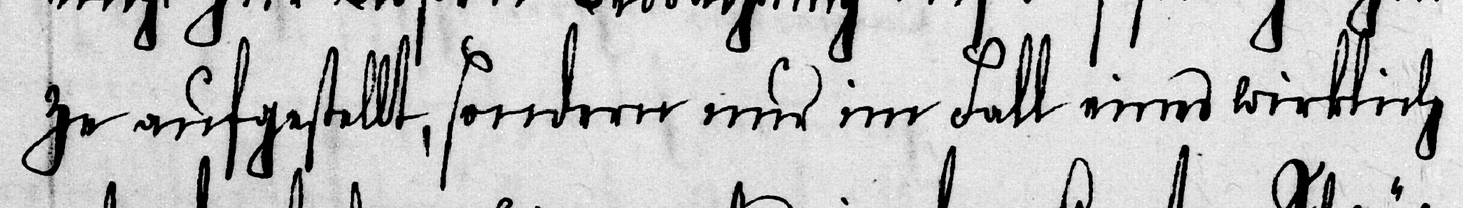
ze aufgestellt, sondern nur im Fall eines wirklich
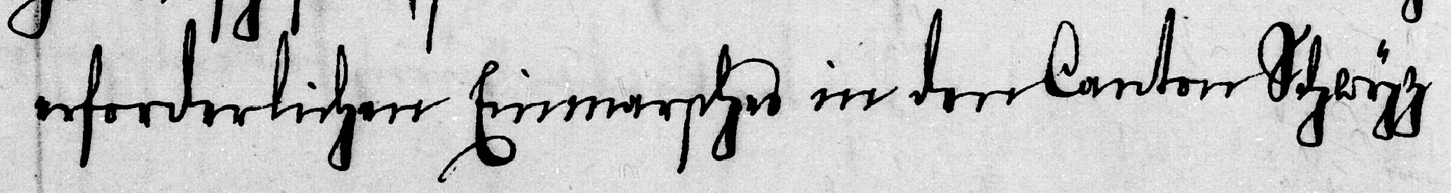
erforderlichen Einmarsches in den Canton Schwyz
